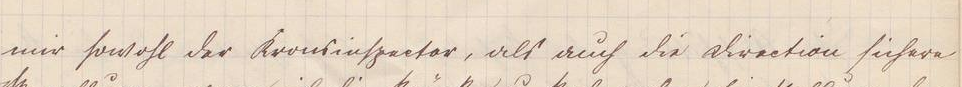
mir sowohl der Kronsinspector, als auch die Direction sichere
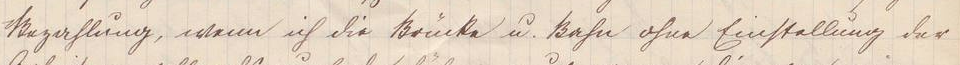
Bezahlung, wenn ich die Brücke u. Bahn ohne Einstellung der
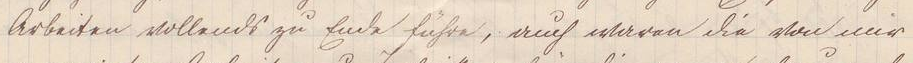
Arbeiten vollends zu Ende führe, auch waren die von mir
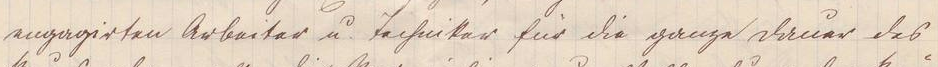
engagirten Arbeiter u. Techniker für die ganze Dauer des
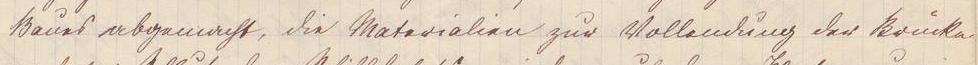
Baues abgemacht, die Materialien zur Vollendung der Brücke
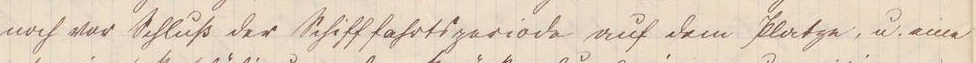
noch vor Schluß der Schifffahrtsperiode auf dem Platze, u. eine
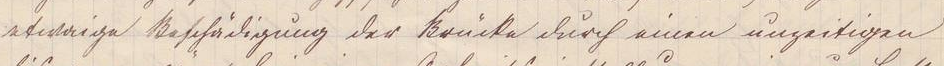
etwaige Beschädigung der Brücke durch einen unzeitigen
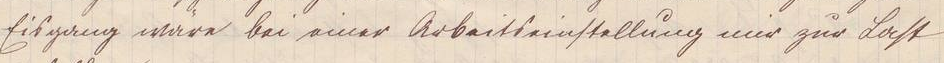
Eisgang wäre bei einer Arbeitseinstellung mir zur Last
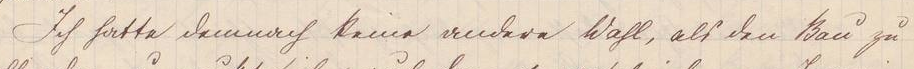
Ich hatte demnach keine andere Wahl, als den Bau zu
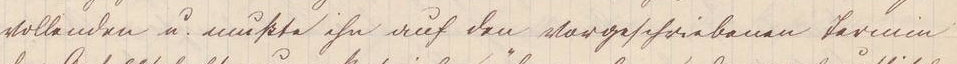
vollenden u. mußte ihn auf den vorgeschriebenen Termin
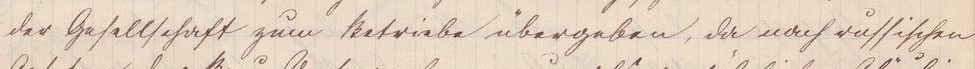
der Gesellschaft zum Betriebe übergeben, da nach russischen
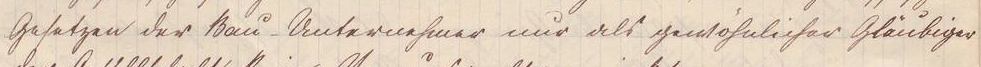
Gesetzen der Bau-Unternehmer nur als gewöhnlicher Gläubiger
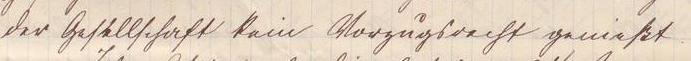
der Gesellschaft kein Vorzugsrecht genießt.
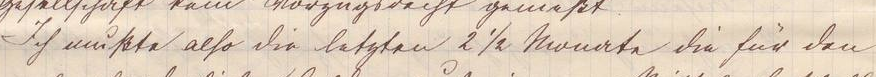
Ich mußte also die letzten 2½ Monate die für den
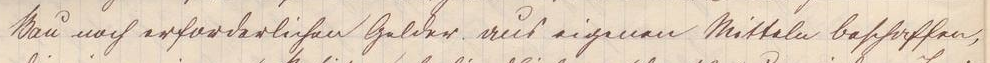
Bau noch erforderlichen Gelder aus eigenen Mitteln beschaffen,
